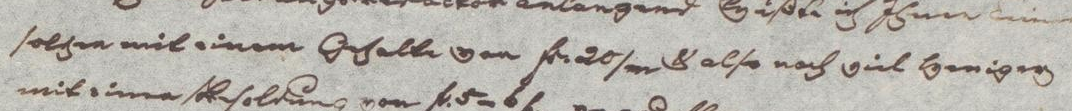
solchen mit einem Gehalte von fr. 20 /m & also noch viel weniger
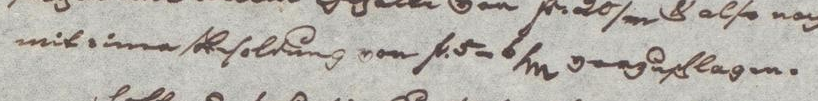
mit einer Besoldung von Fr. 5–6 /m vorzuschlagen.
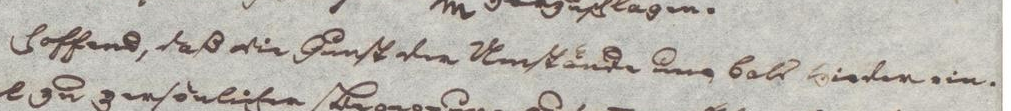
Hoffend, daß die Gunst der Umstände uns bald wieder ein-
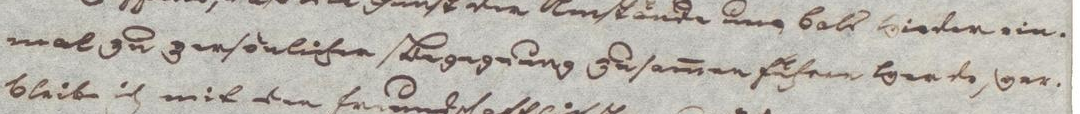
mal zu persönlicher Begegnung zusammenführen werde, ver-
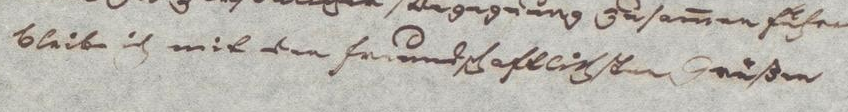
bleibe ich mit den freundschaftlichsten Grüßen
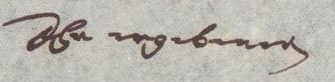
Ihr ergebener
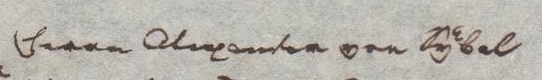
Herrn Alexander von Sybel
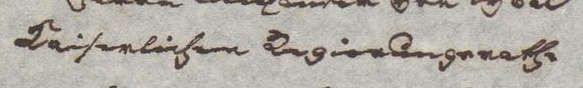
Kaiserlichem Regierungsrathe
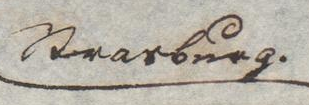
Strasburg.
